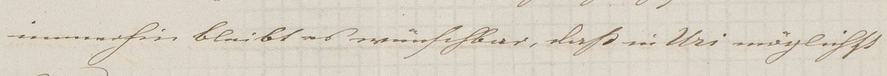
immerhin bleibt es wünschbar, daß in Uri möglichst
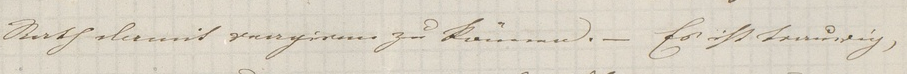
Rath damit reagiren zu können. – Es ist traurig,
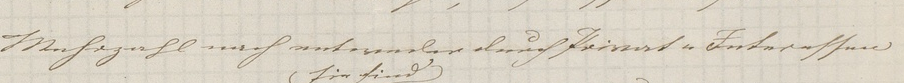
Mehrzahl nach entweder durch Privat-Interessen
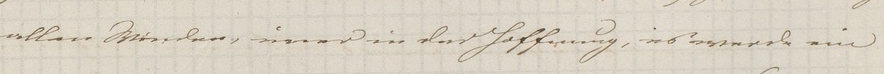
allen Winden, immer in der Hoffnung, es werde ein
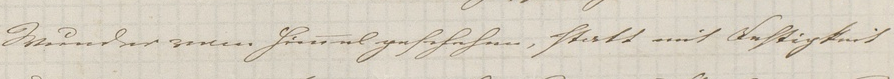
Wunder vom Himmel geschehen, statt mit Festigkeit
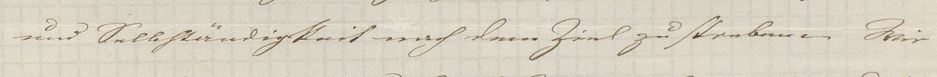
und Selbständigkeit nach dem Ziel zu streben. Wir
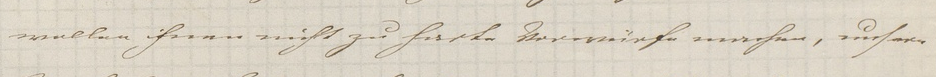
wollen ihnen nicht zu harte Vorwürfe machen, unsere
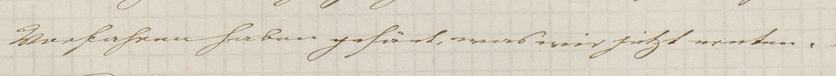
Vorfahren haben gesäet, was wir jetzt ernten. –
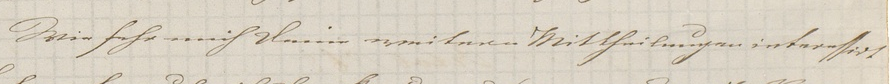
Wie sehr mich Diene weitern Mittheilungen interessirt
